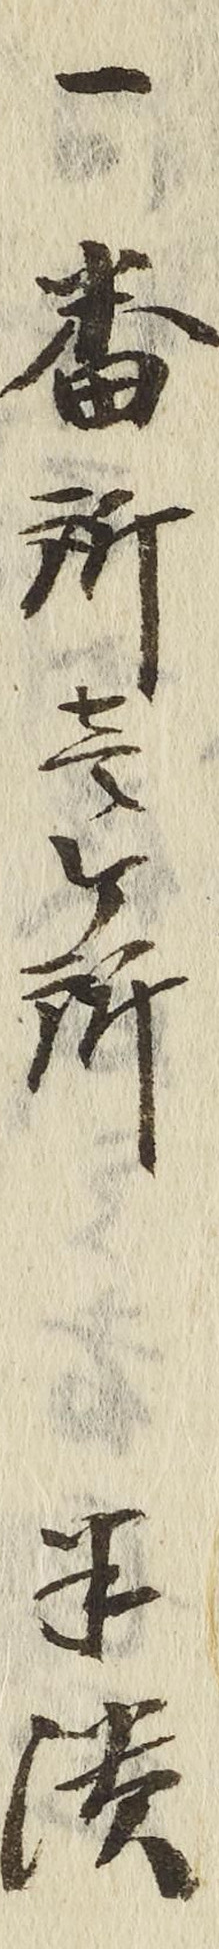一番所壱ヶ所半潰
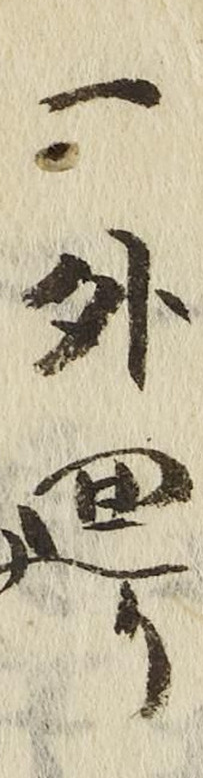一外廻り
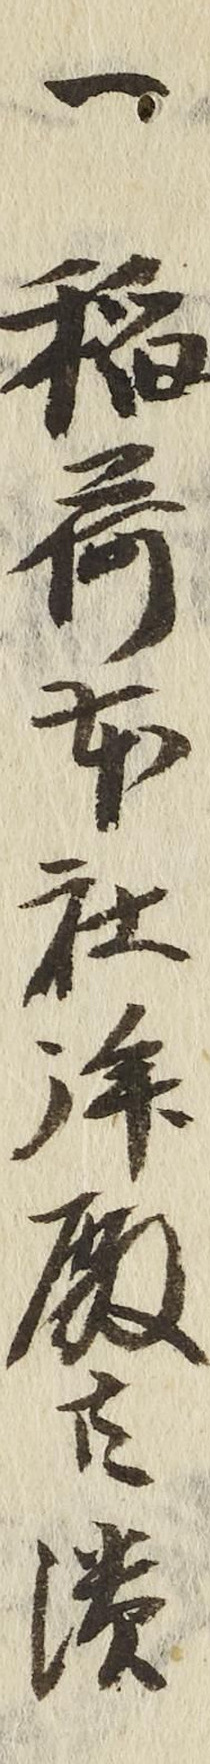一稲荷本社拝殿共潰
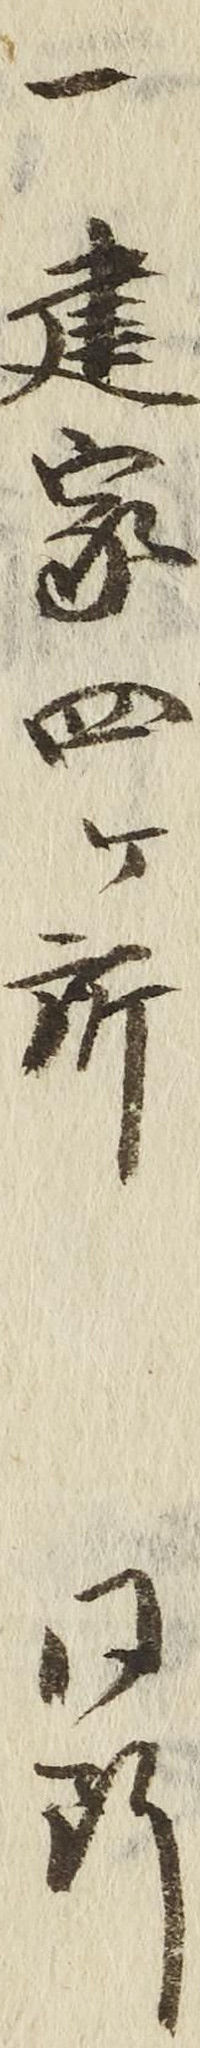一建家四ヶ所同断
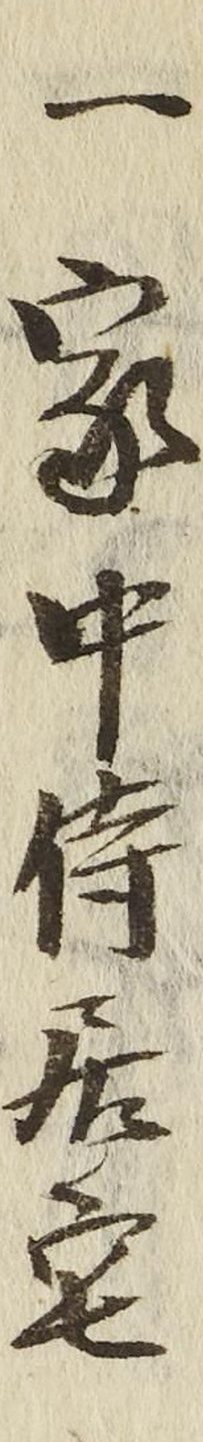一家中侍居宅
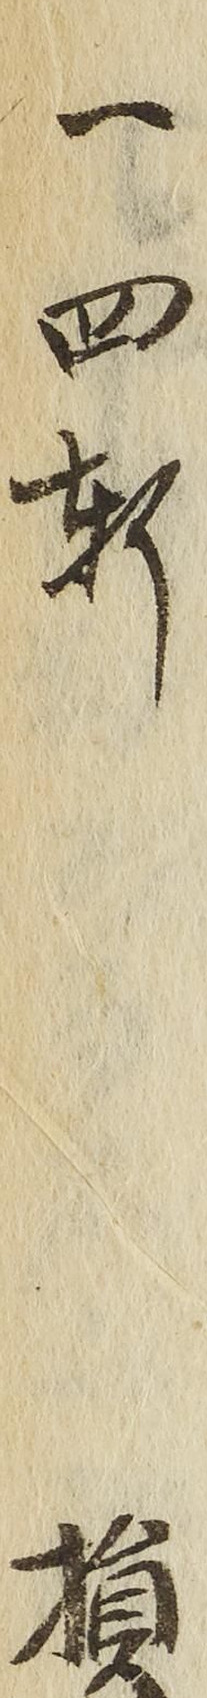一四軒損

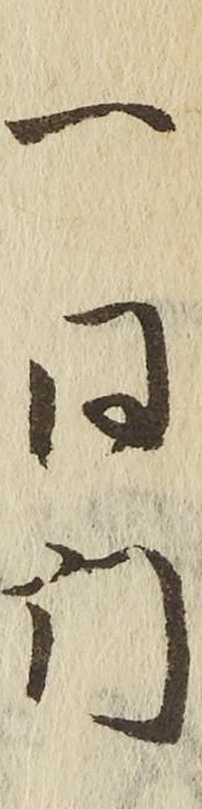一同門
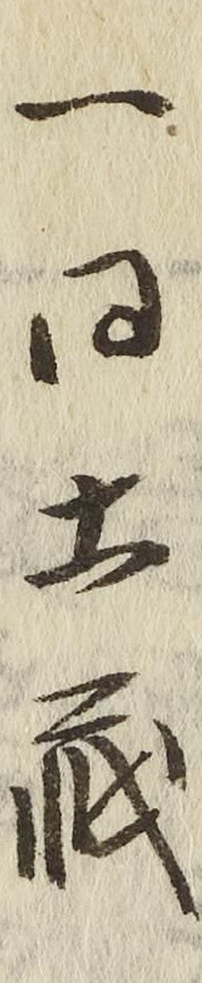一同土蔵
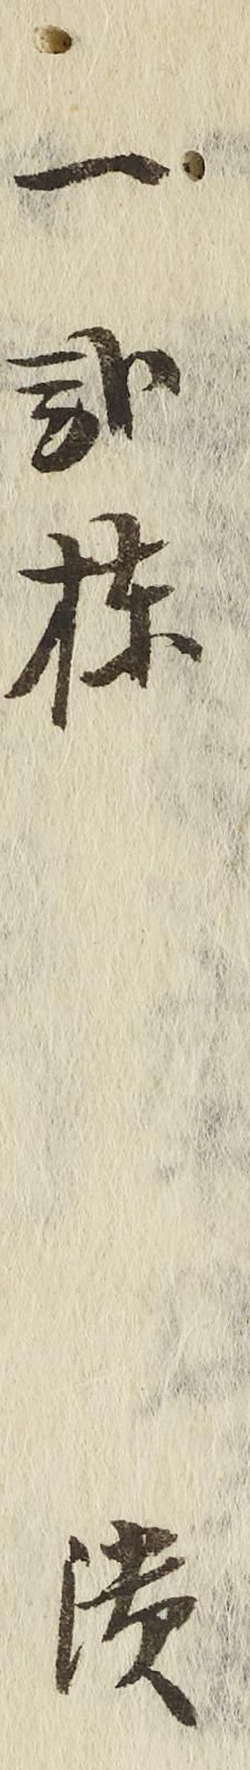一弐棟損
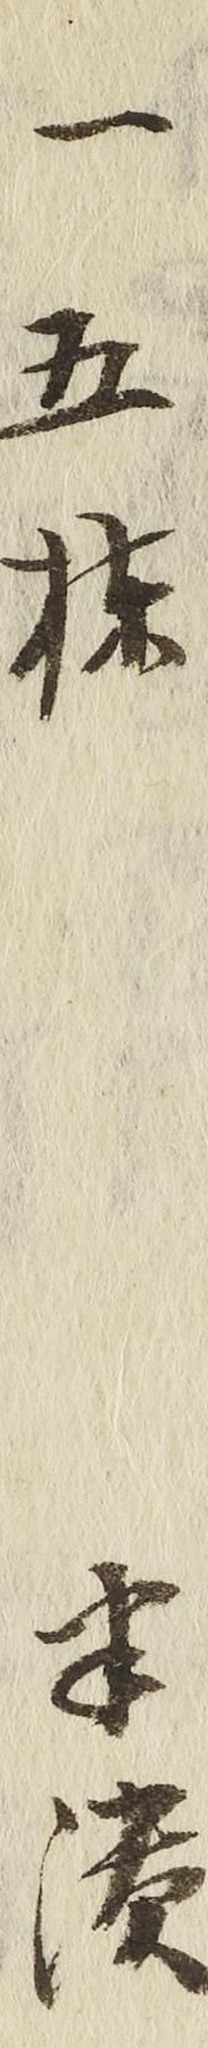一五棟半潰
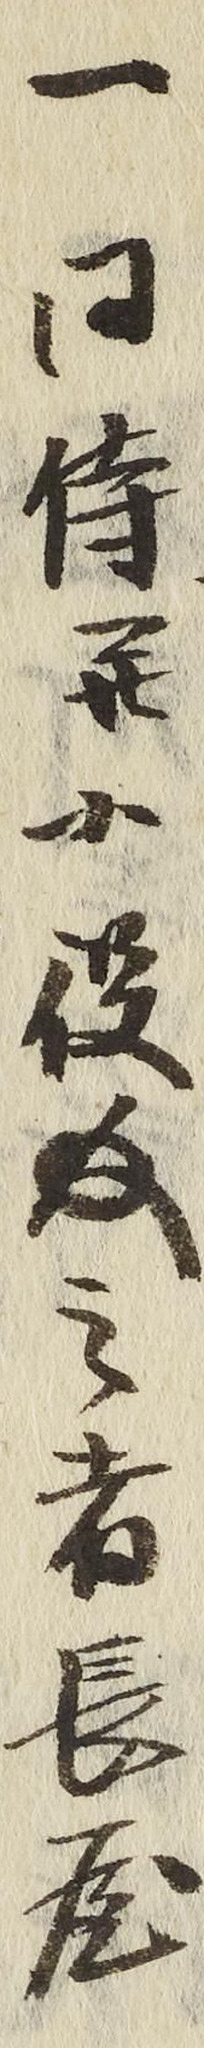一同侍并小役人之者長屋
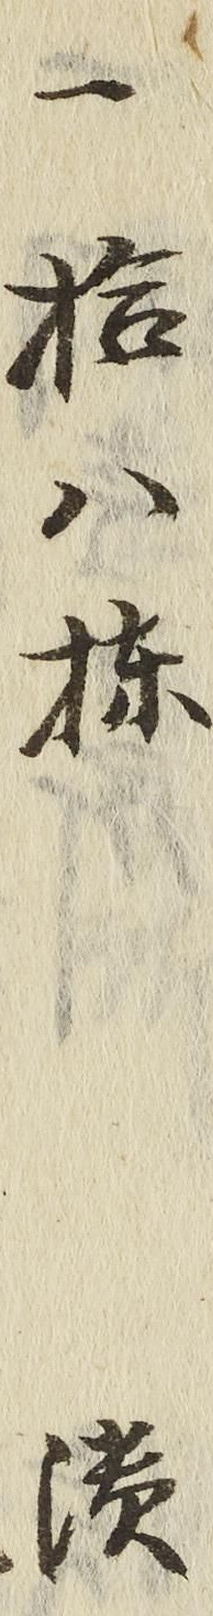一拾八棟潰
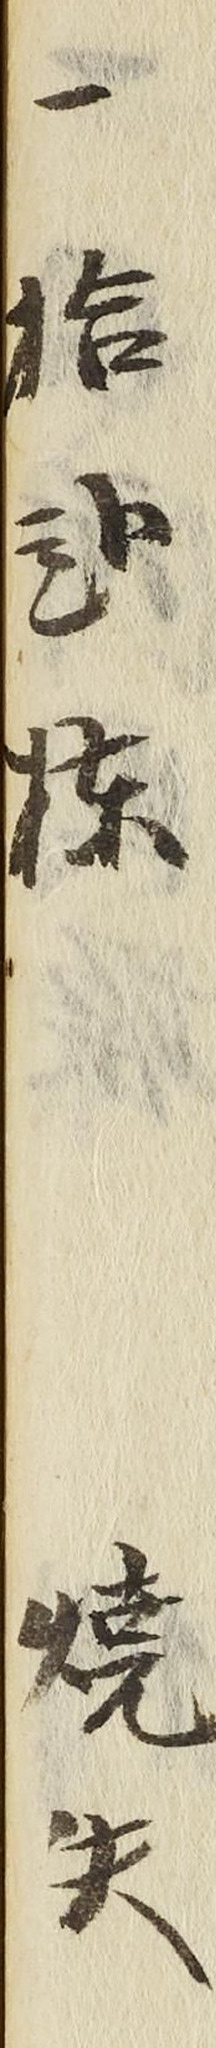一拾弐棟焼失
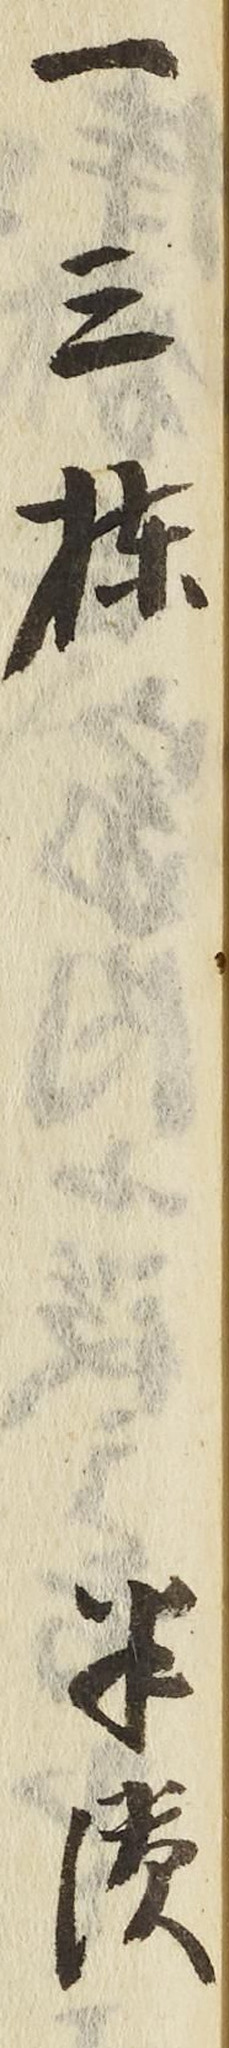一三棟半潰
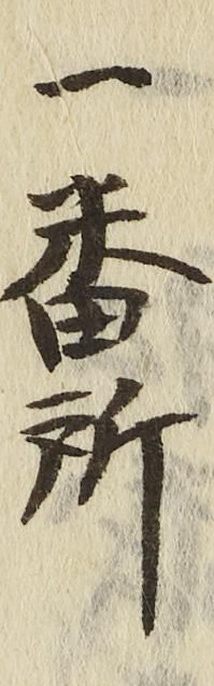一番所
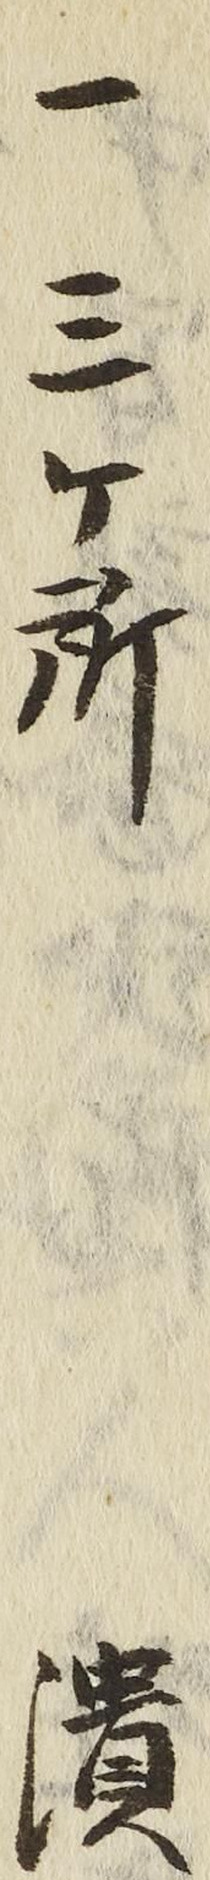一三ヶ所潰
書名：信濃國大地震記　乾
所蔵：東京大学地震研究所図書室 Earthquake Research Institute Library, The University of Tokyo, JAPAN
